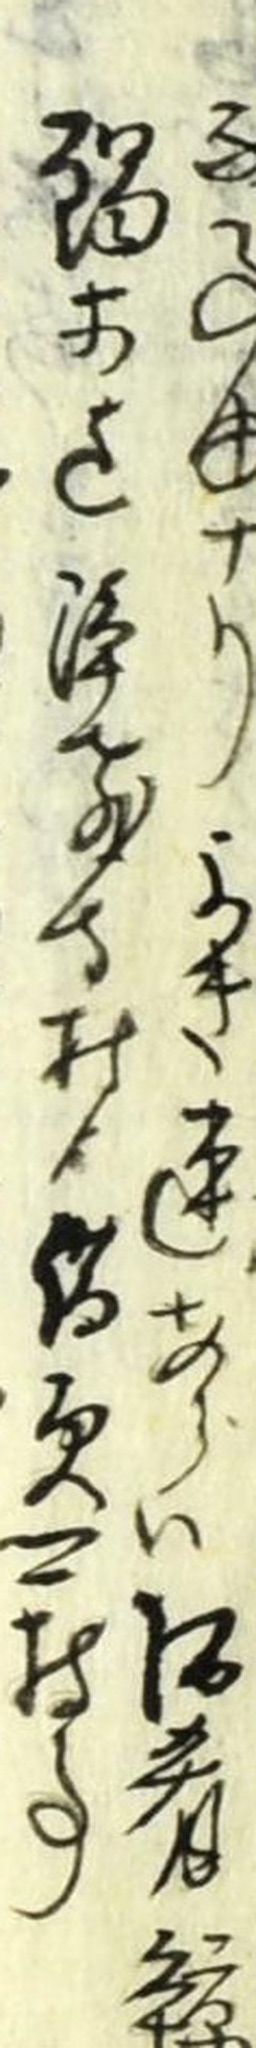鍋等迄浄教寺村ゟ借受可持事
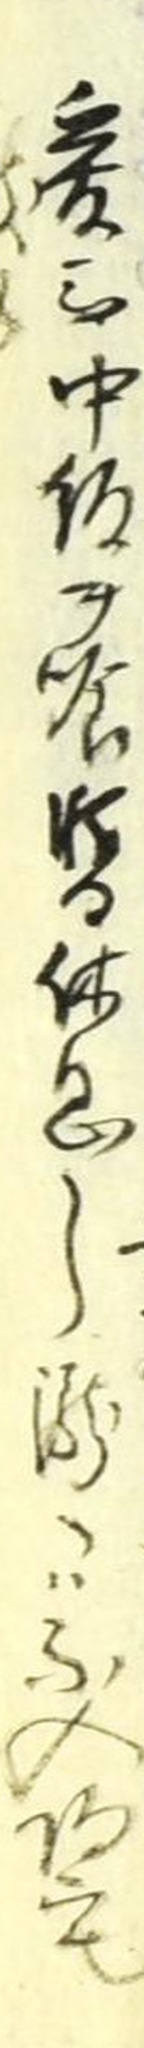爰ニ而中飯ヲ喰暫休息し瀧へハ不入帰宅

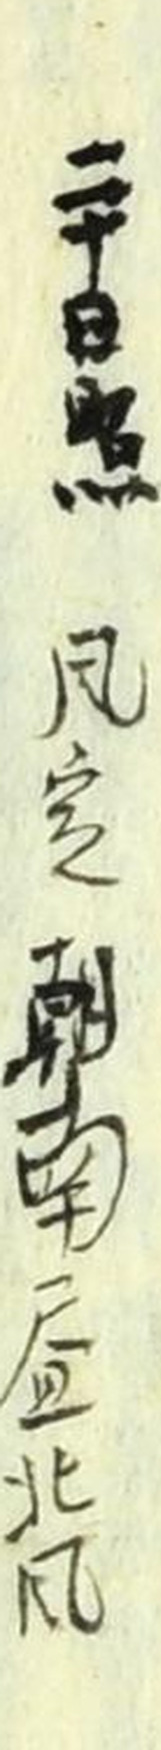二十日照風定朝南昼北風
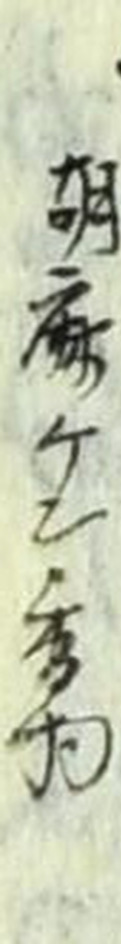胡麻ケン香物
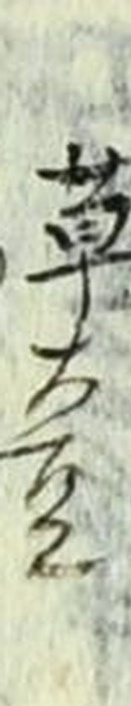草大豆
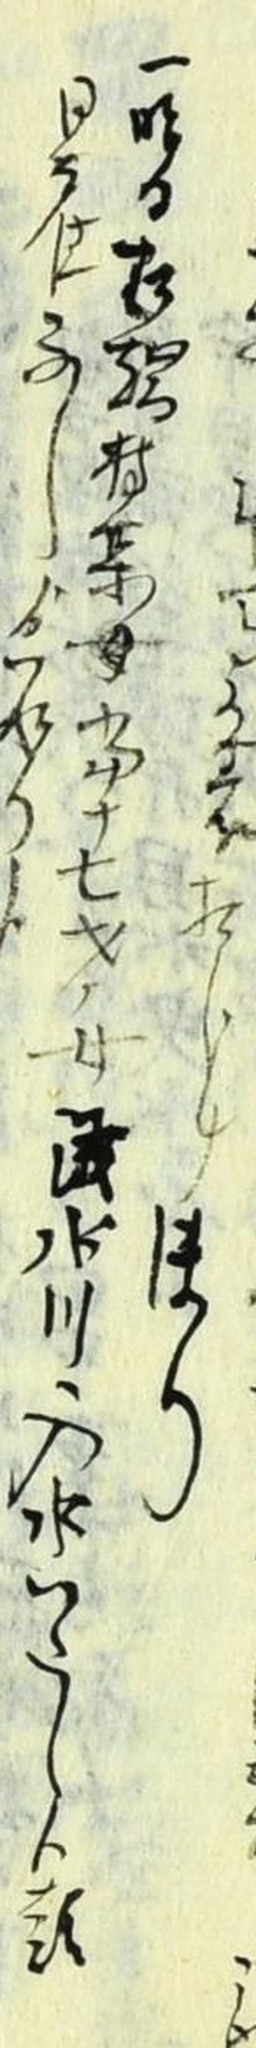一昨日江端村某女当十七才ノ女浅水川へ入水いたし候趣
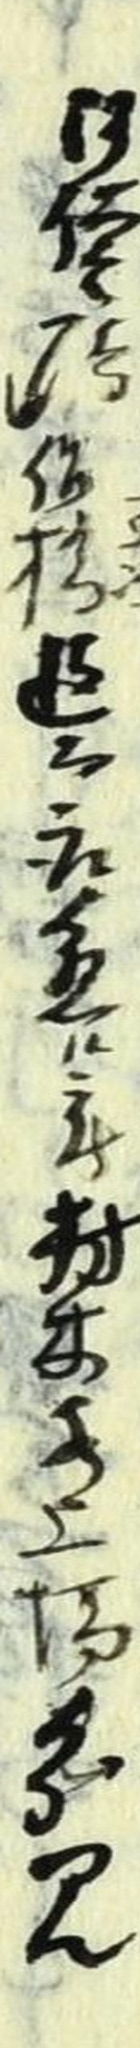河饒島作橋追而取懸ルニ付材木水上場分見
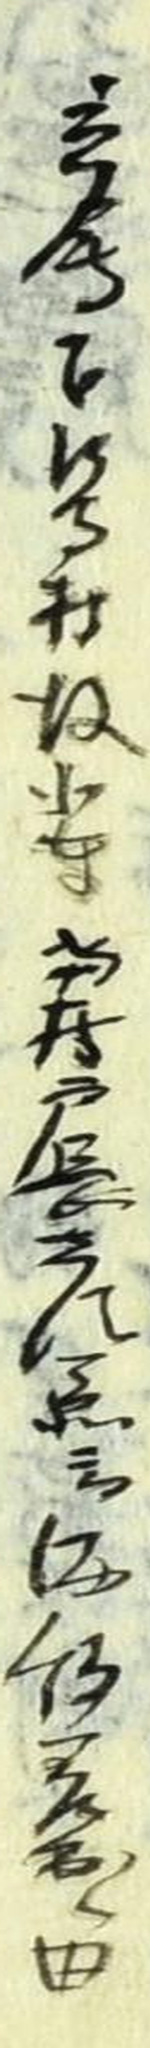立会下江守村役輩当村戸長彦兵衛ニ而酒飯差出候由
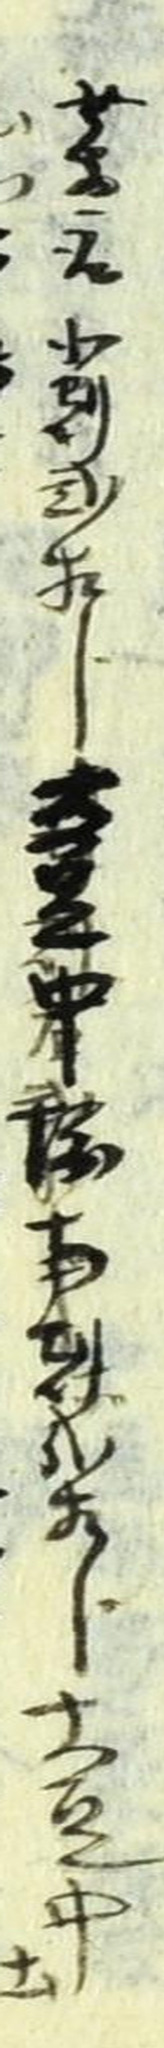草取北割弐拾歩大豆中掘南割弐拾歩大豆中出
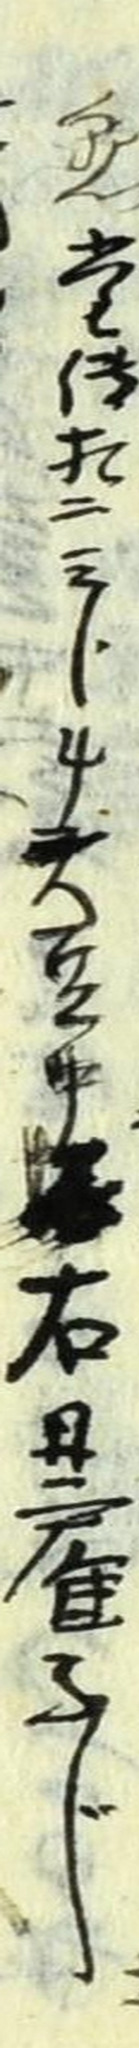懸堂伝拾二三歩計大豆中掘右日雇ふじ
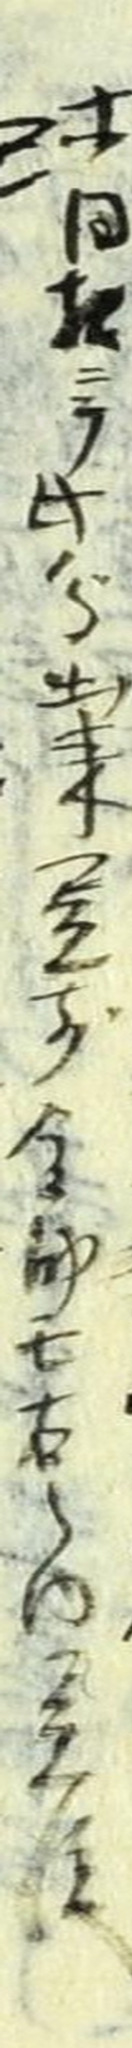等同様ニテ此分出来昼前金助モ右之内昼後
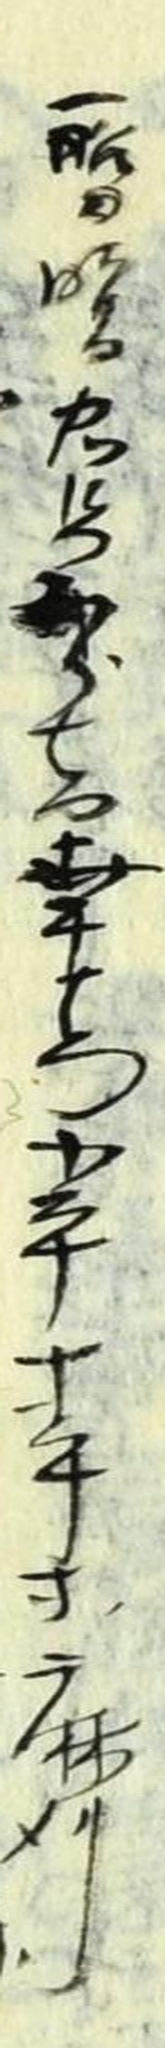一昨日昨日忠左衛門五郎右衛門幸右衛門小平十平等麻刈
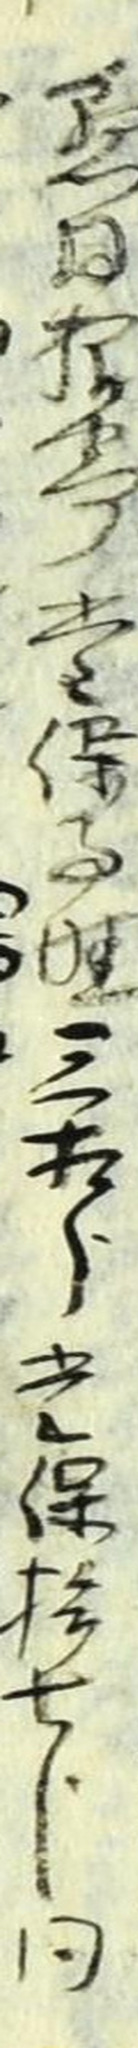懸同根寄堂保事畔三拾歩堂保拾七歩同
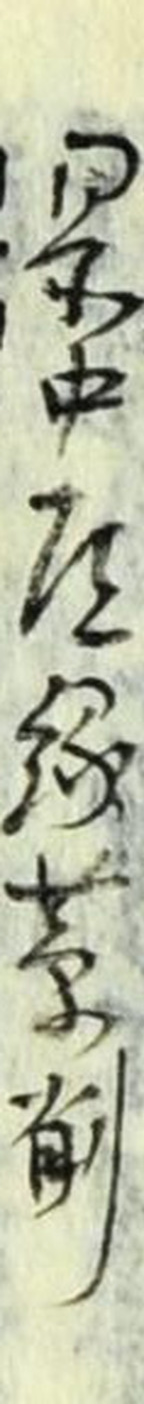同所中道縁草削
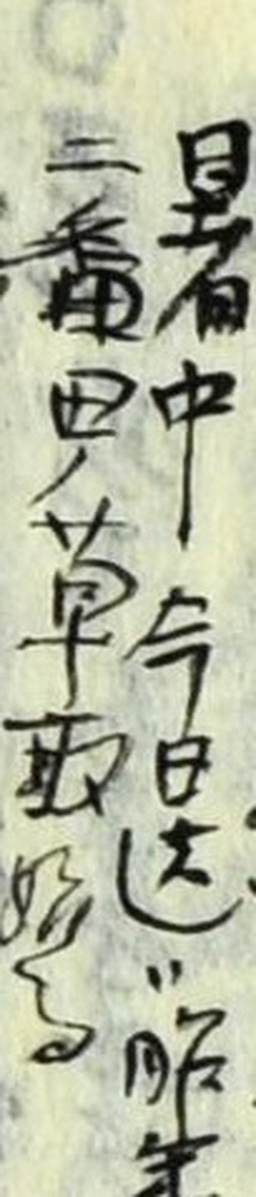二番田ノ草取始る
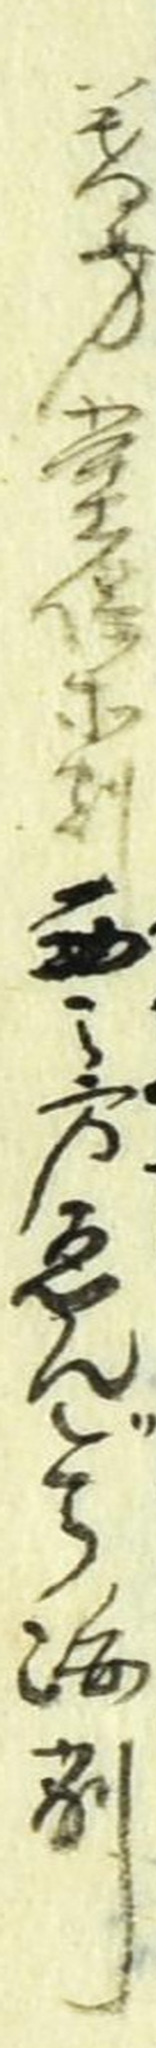暮方堂保北割西之方ゑんどう跡削
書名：（日記）
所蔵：福井県文書館 Fukui Prefectural Archives
